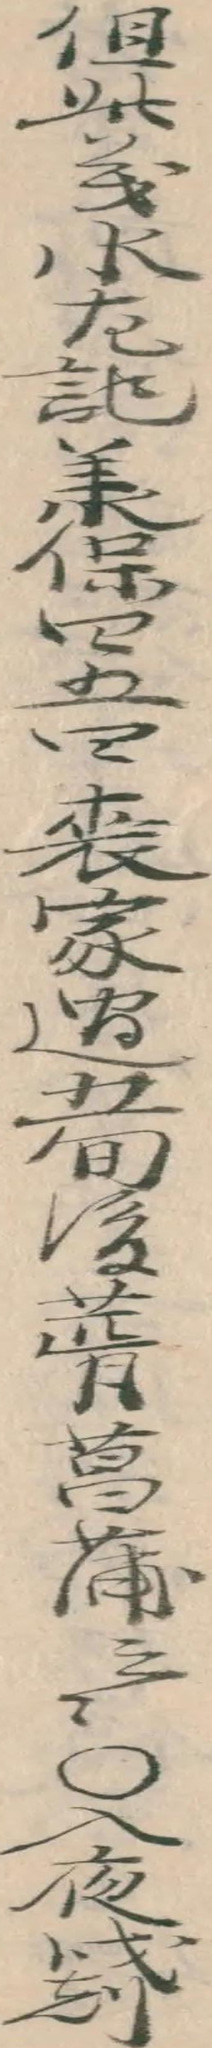但此義水左記承保四五四喪家過五旬後葺菖蒲云々〇入夜戌刻
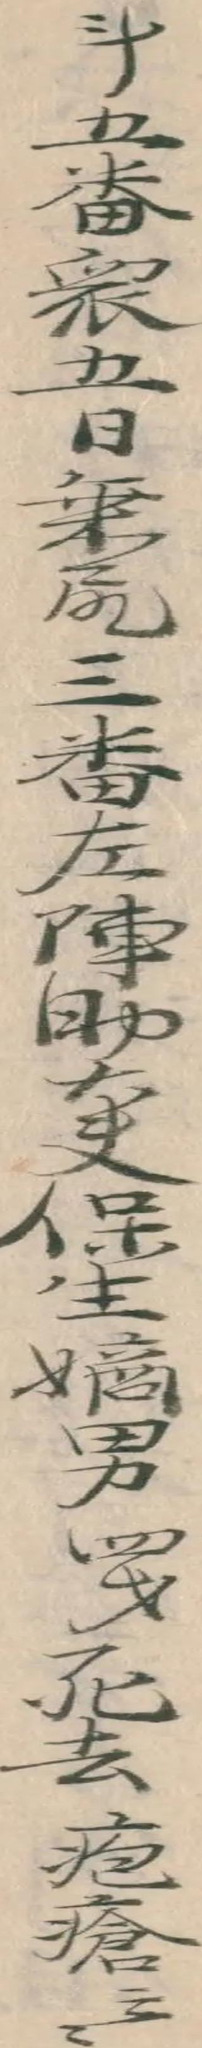斗五番衆五日乗尻三番左陣助大夫保生嫡男四才死去疱瘡云々
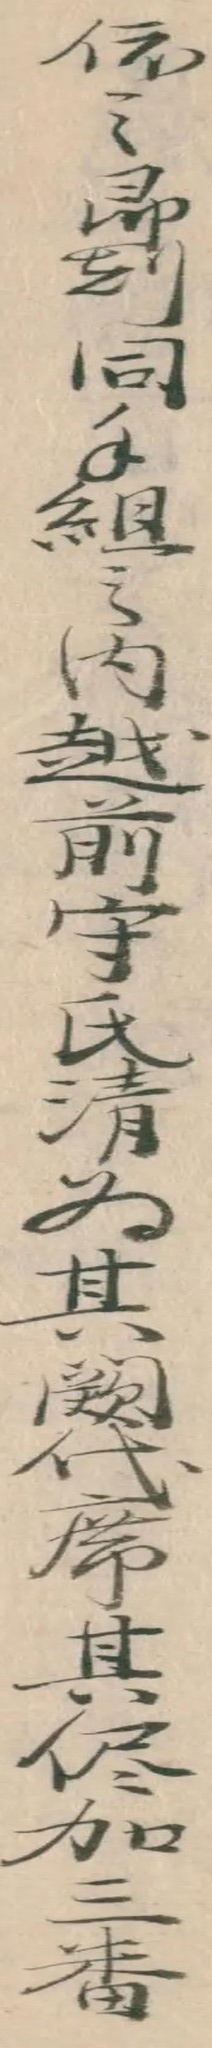依之即刻同手組之内越前守氏清為其闕代席其侭加三番
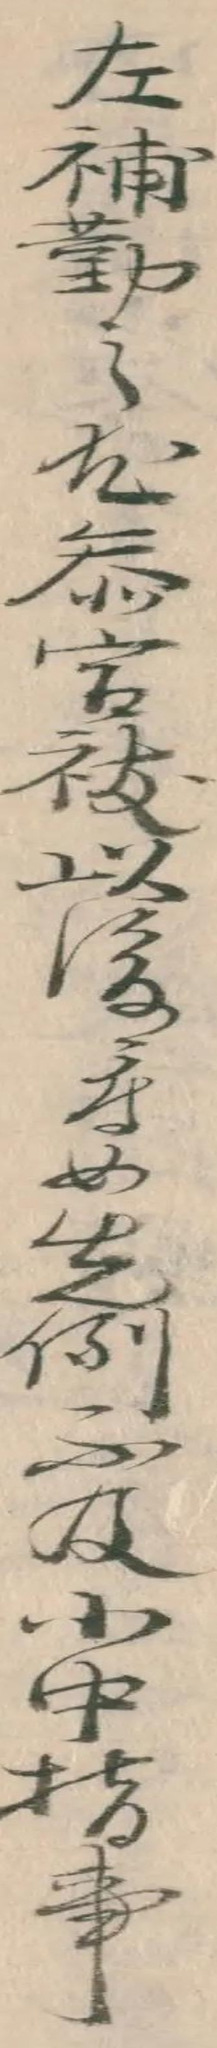左補勤之尤参宮祓以後ニ付如先例不及小中指事
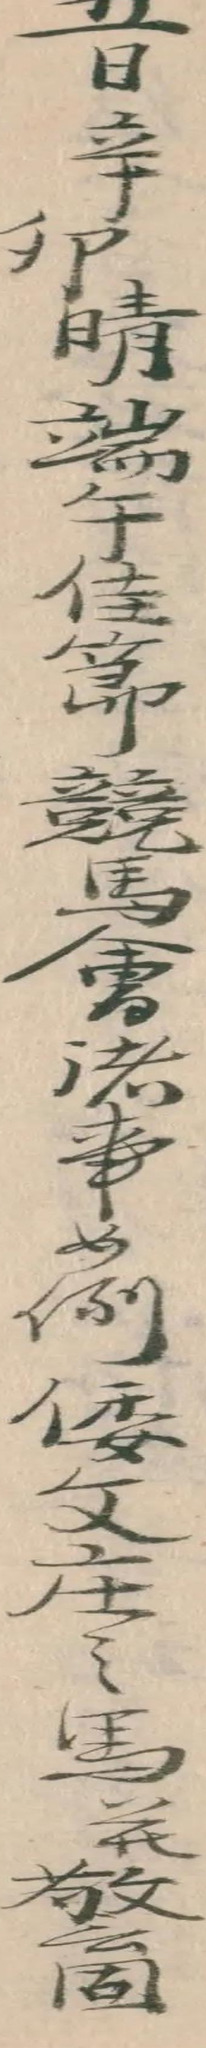五日辛卯晴端午佳節競馬會諸事如例倭文庄之馬幷警固
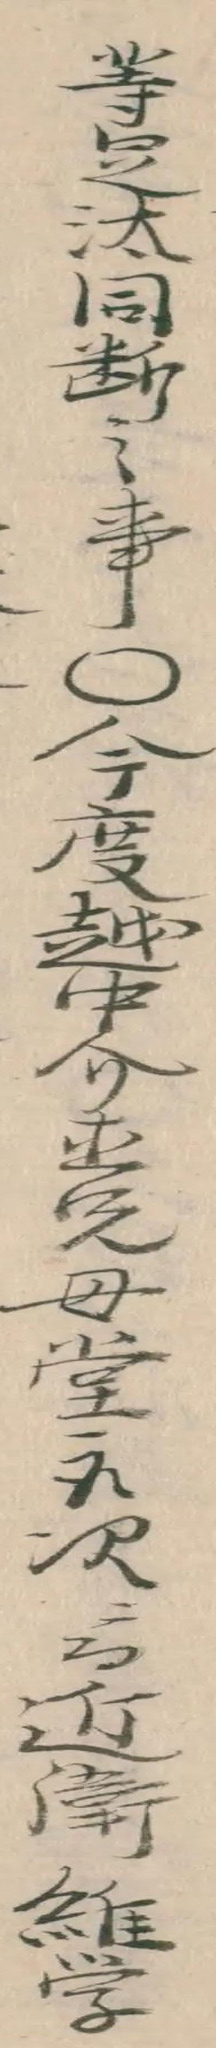等足汰同断之事○今度越中介直兄母堂取次ニ而近衛維学
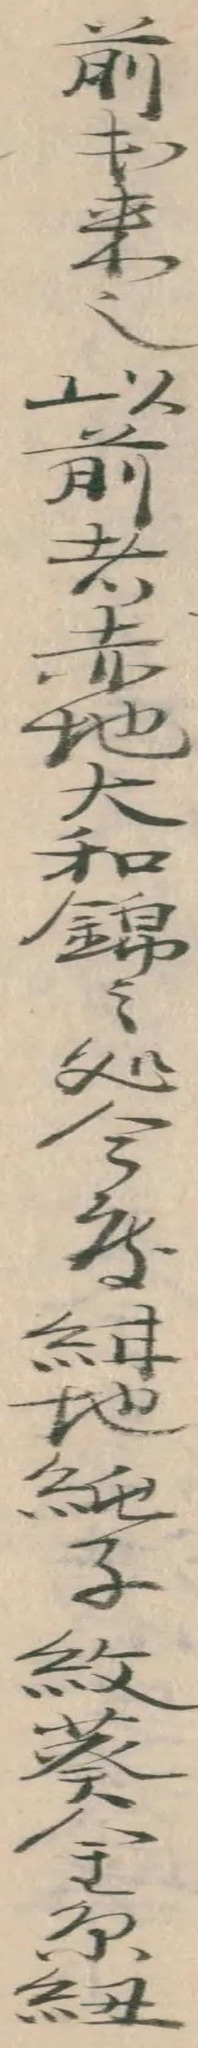前義来也以前者赤地大和錦之処今度紺地純子紋葵金糸紐
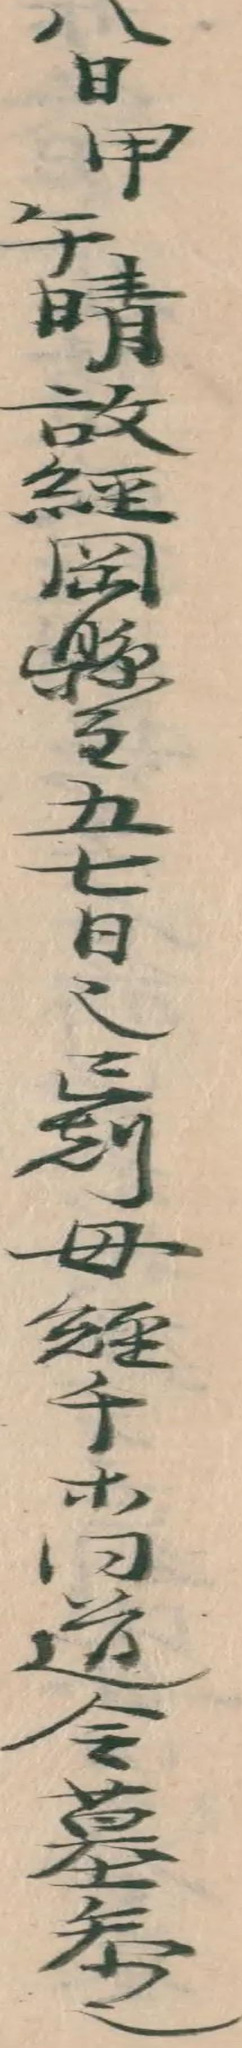八日甲午晴故経岡縣主五七日也巳刻母經千等同道令墓参也
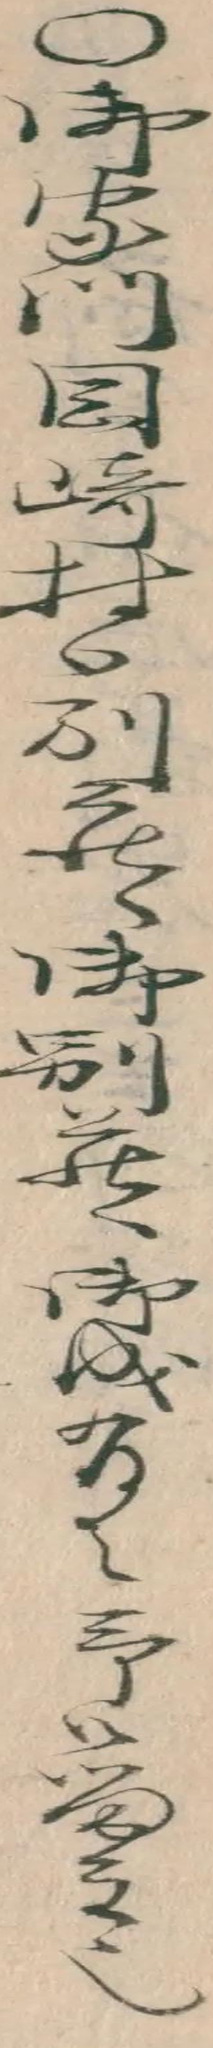○御家門岡崎村御別荘へ御別荘へ御成有之予御留主也
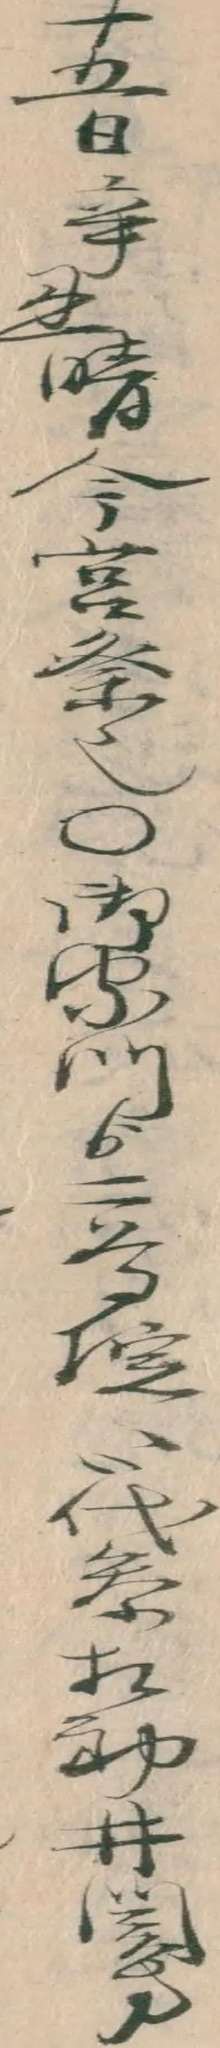十五日辛丑晴今宮祭也○御家門ゟ二尊院へ御代参相勤井関方
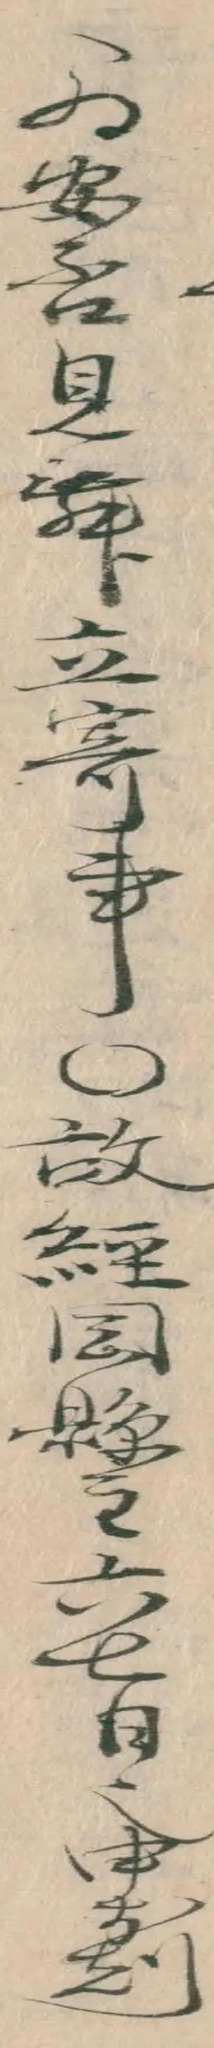へ為安否見舞立寄事○故経岡縣主六七日之申前刻
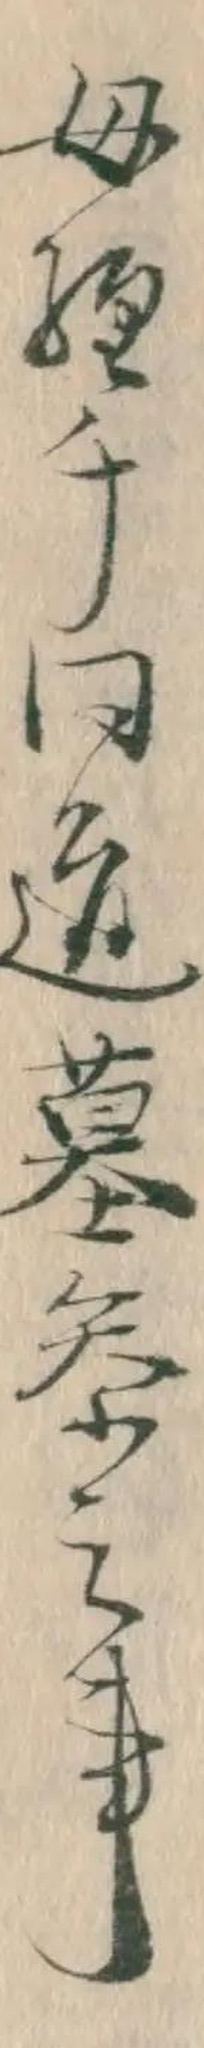母経手同道墓参之事
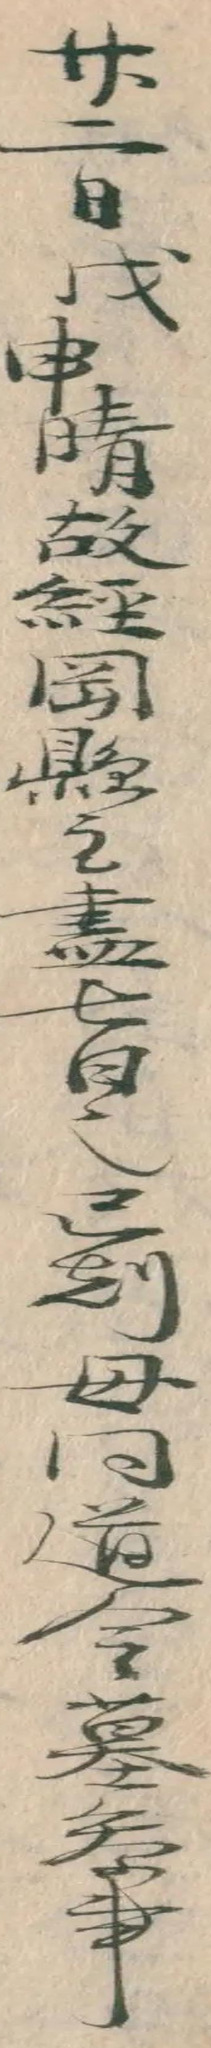廿二日戊申晴故経岡縣主盡七日也巳刻母同道令墓参事
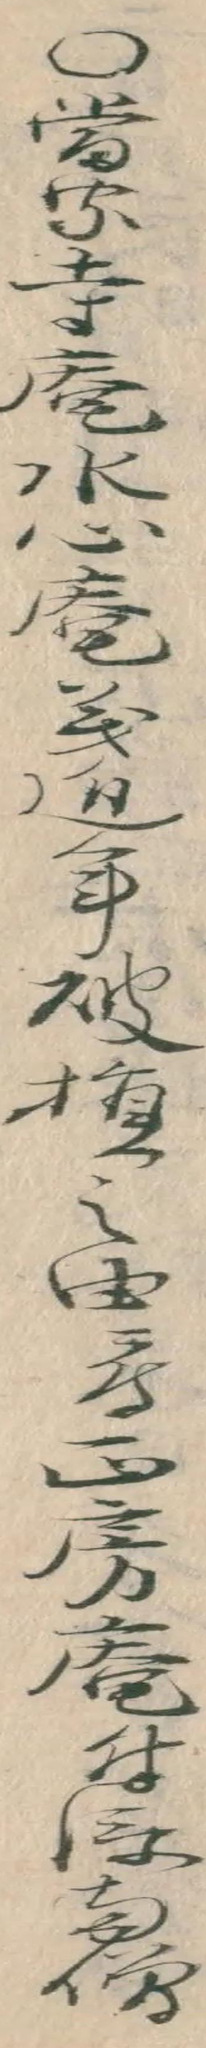○當家寺庵水心庵義近年破損之由ニ付正房庵付添両僧
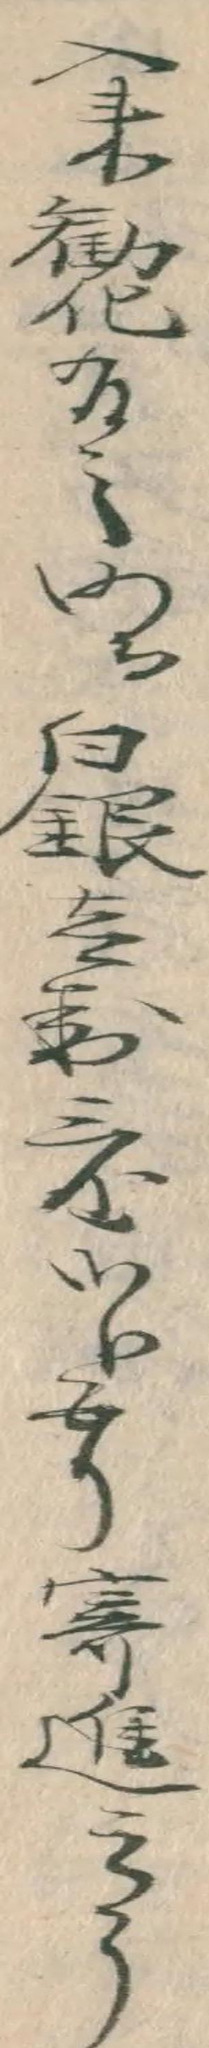入来勧化有之仍而白銀壱分三匁弐分五り寄進之了
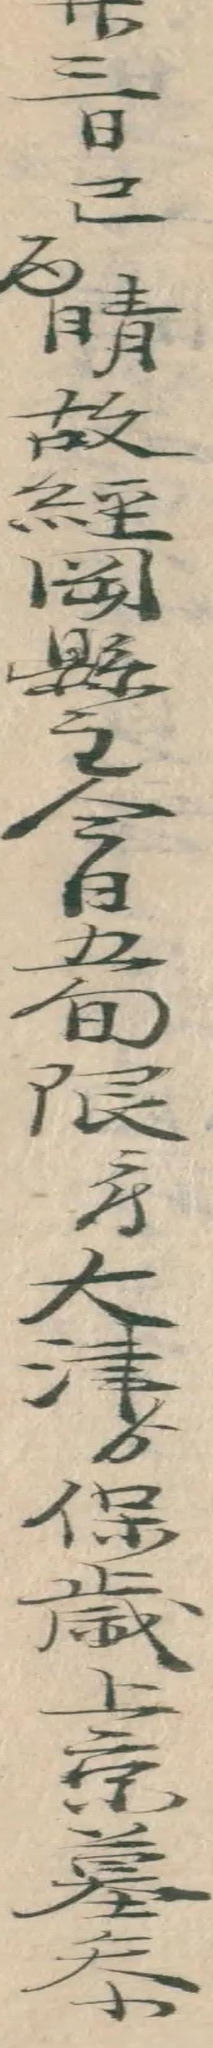廿三日己酉晴故経岡縣主今日五旬限ニ付大津ゟ保歳上京墓参
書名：賀茂社記録. 第65冊
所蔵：国立国会図書館 National Diet Library, JAPAN
